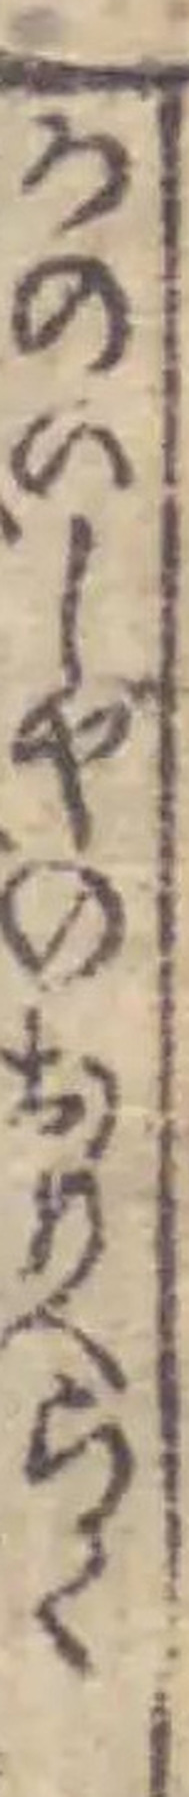かのいしやのおもへらく
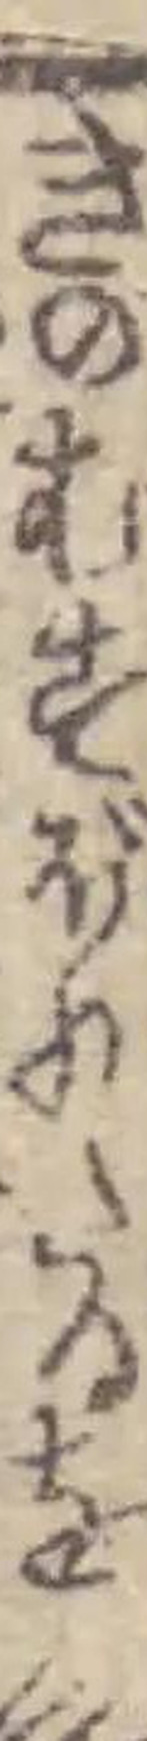きのむすぼれたるを
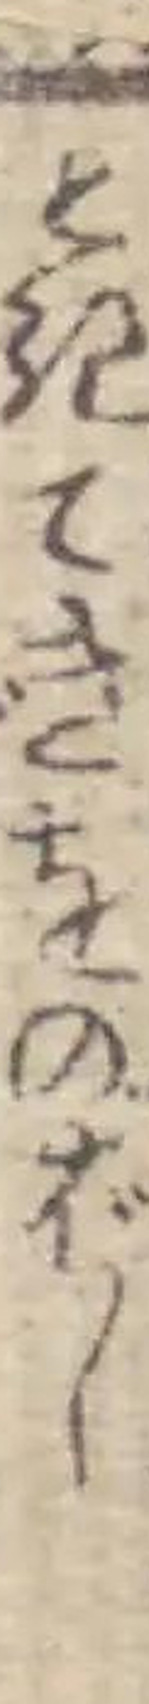ときてきをのばし
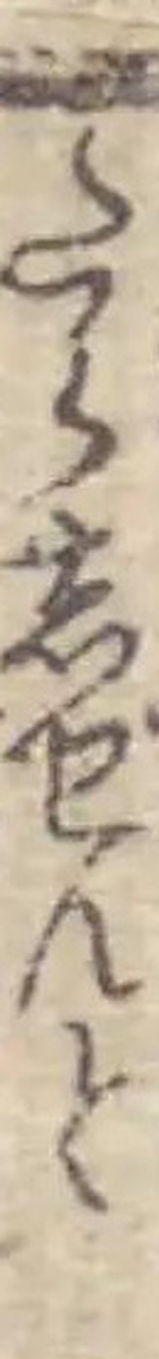たらしぜんと
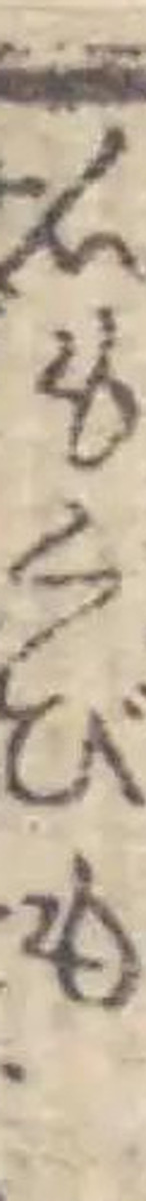心もくびも
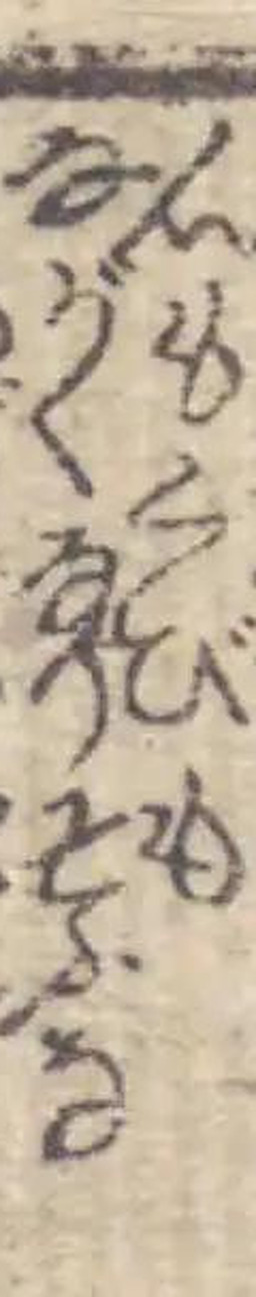ながくなりそふな
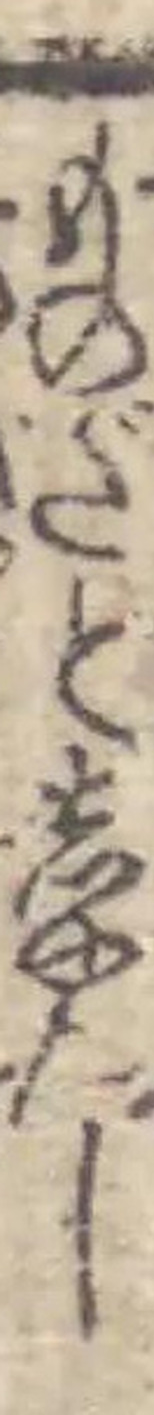ものだとしやんし
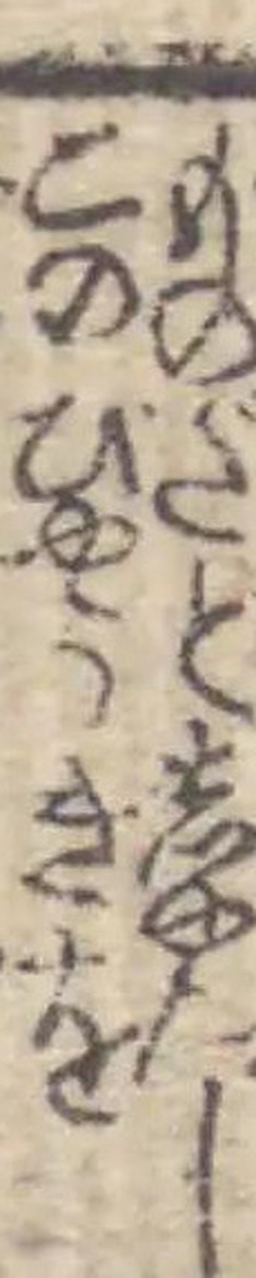このびやうきを
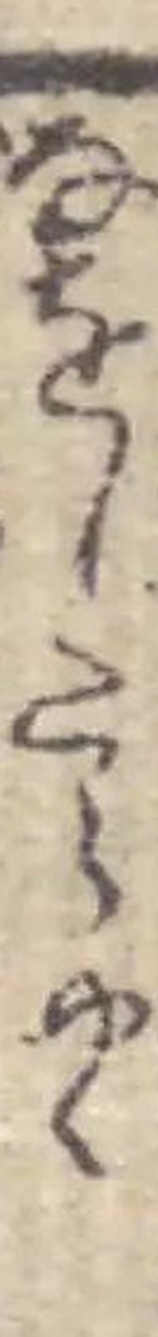なをしたらやく
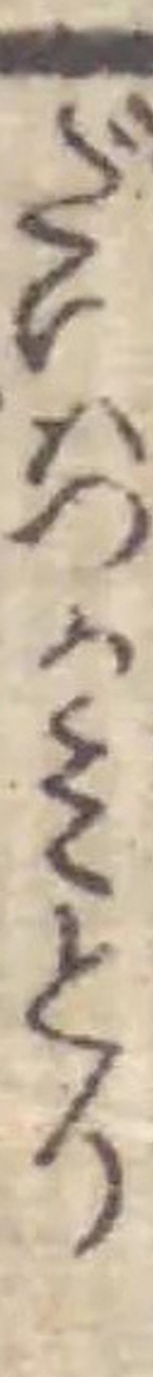だいはつかみとり
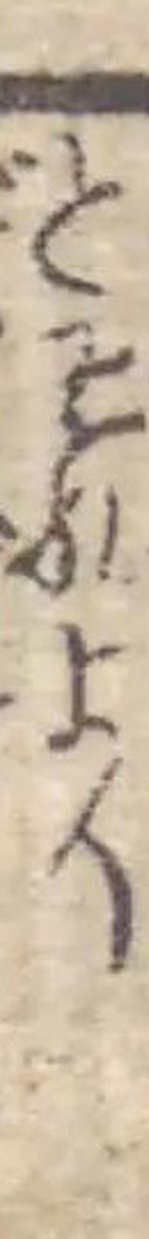とそれより
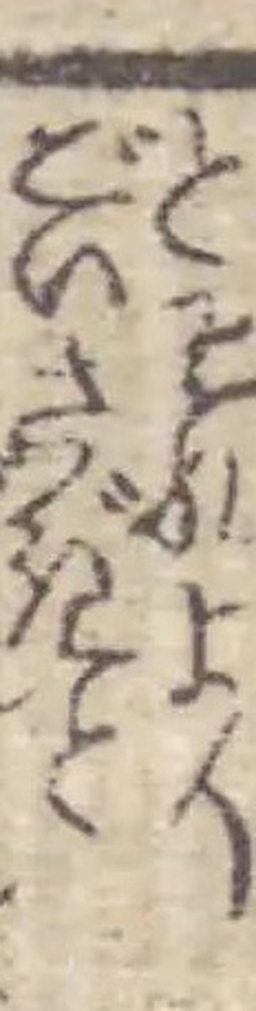ごいさぎと
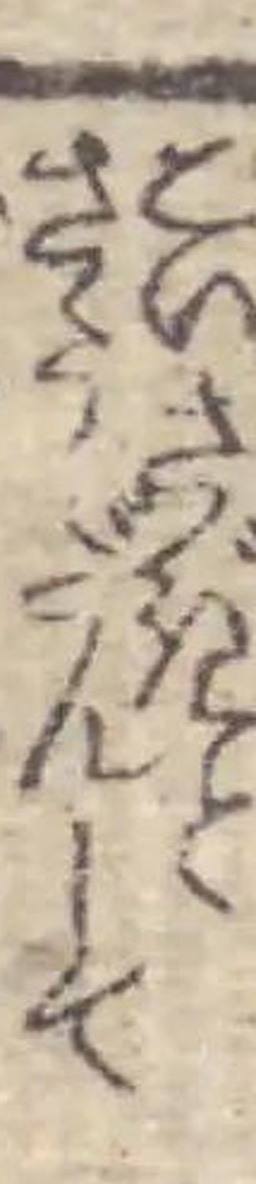さうだんして
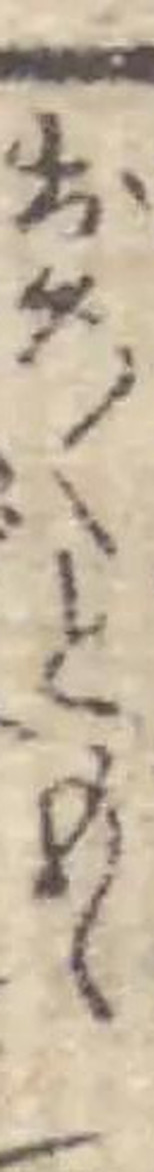おろくともゝ
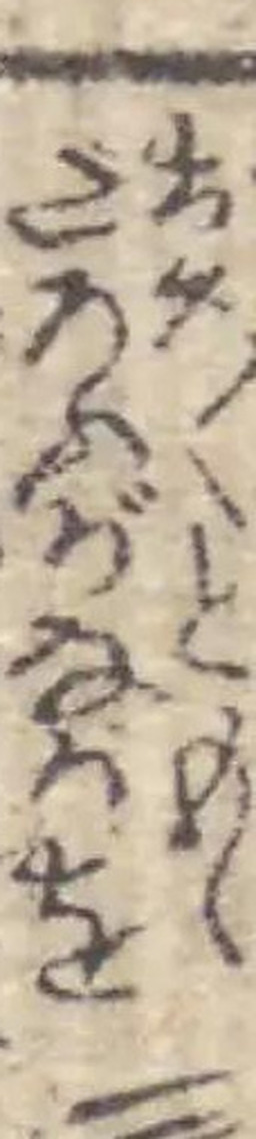たろふがなかを
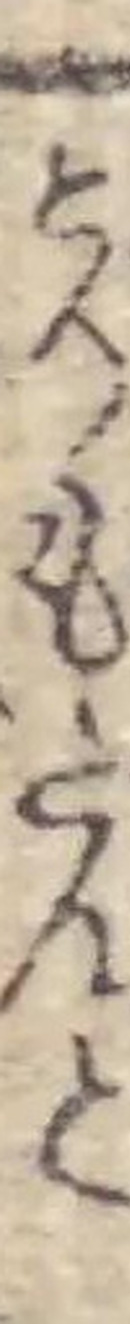とりもたんと
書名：化物尽 4巻
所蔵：国立国会図書館 National Diet Library, JAPAN
